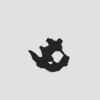出
